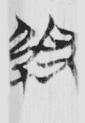{弓夬}
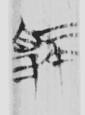{馬午}
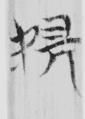{女𡵂}
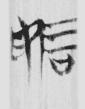妬
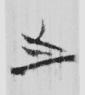之
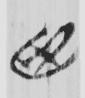臣
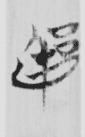{身呂}
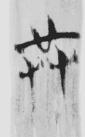共
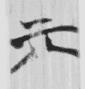亓
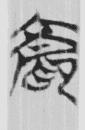{产色}
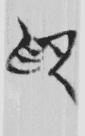色
